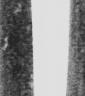者
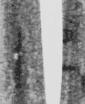也
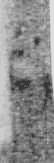未
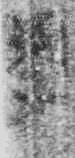○（教）
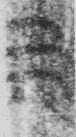而
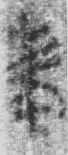民
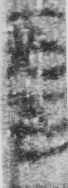恆
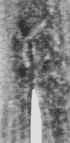眚（性）
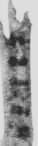善
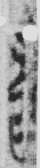者
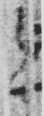也
